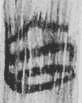百
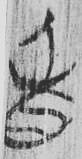眚（姓）
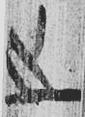之
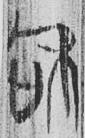和
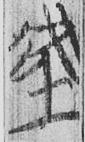○（吾）
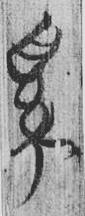○（奚）
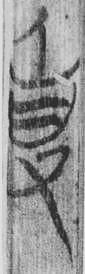事
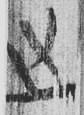之
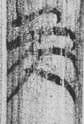天
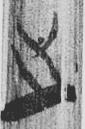之
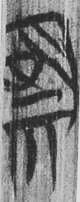○（明）
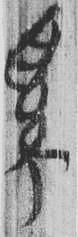○（奚）
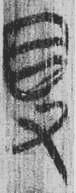○（得）
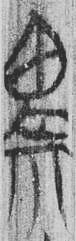○（鬼）
